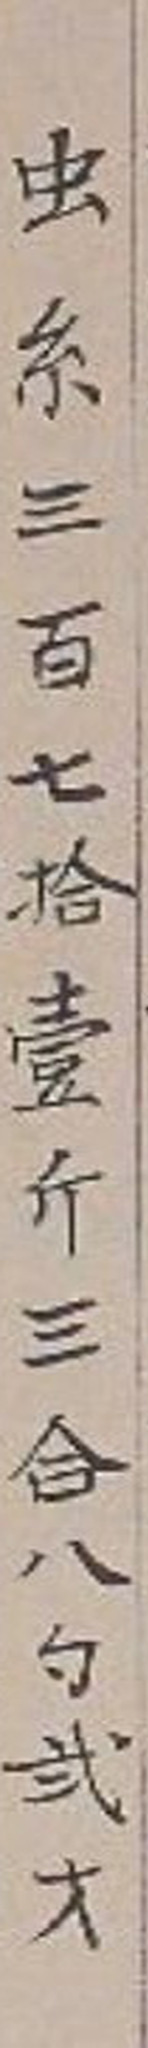虫糸三百七拾壹斤三合八勺弐才
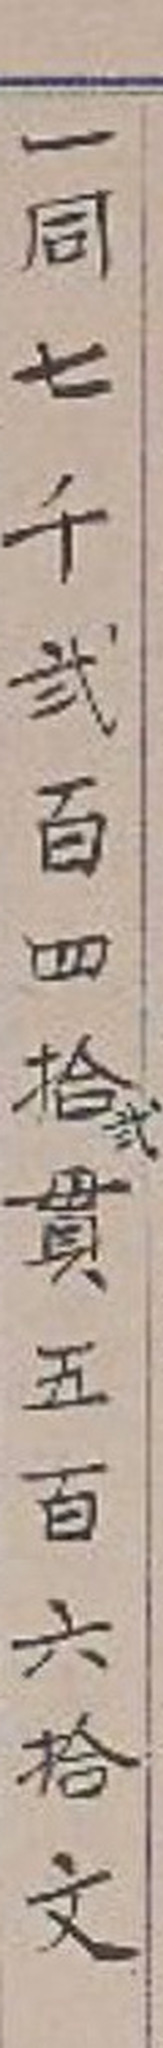一同七千弐百四拾弐貫五百六拾文
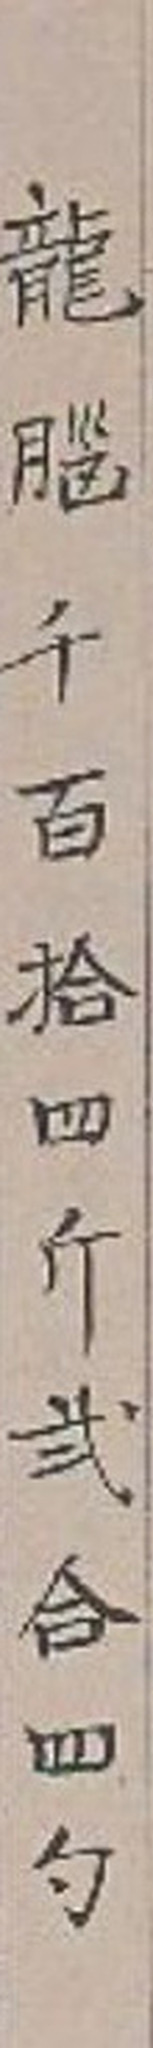龍腦千百拾四斤弐合四勺
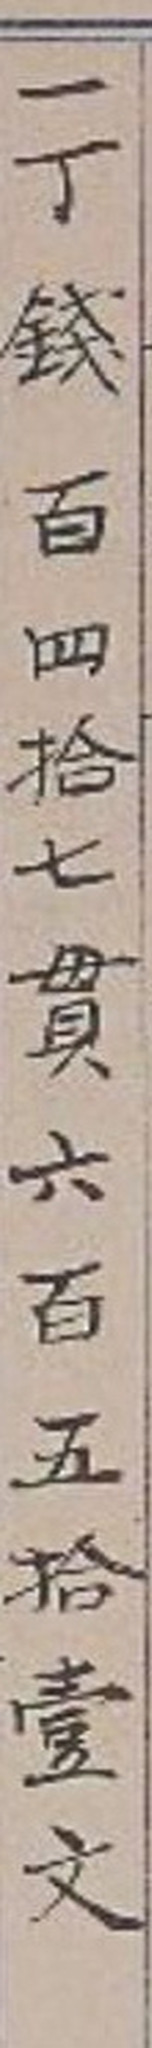一丁錢百四拾七貫六百五拾壹文
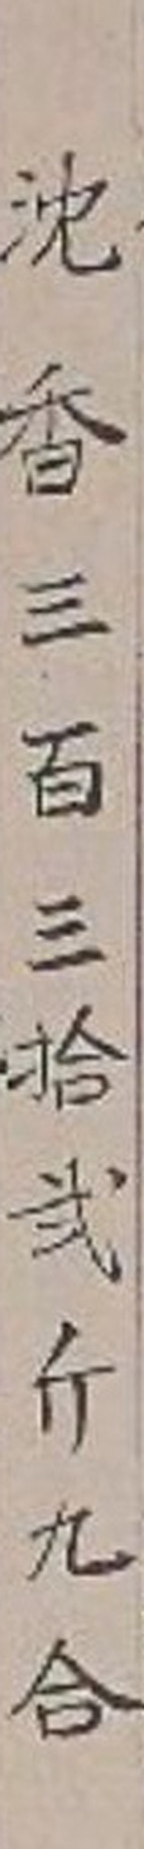沈香三百三拾弐斤九合
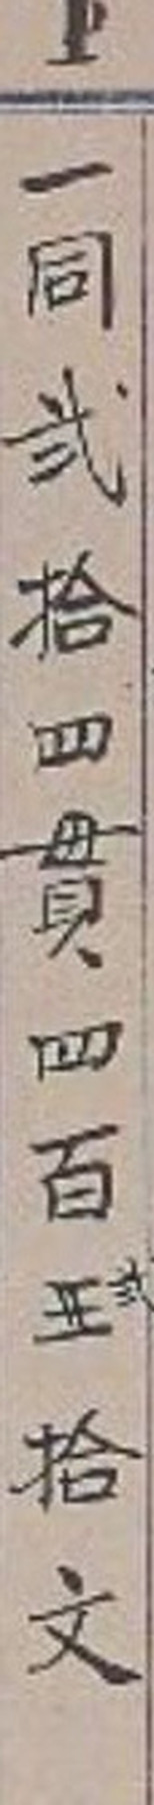一同弐拾四貫百三拾文
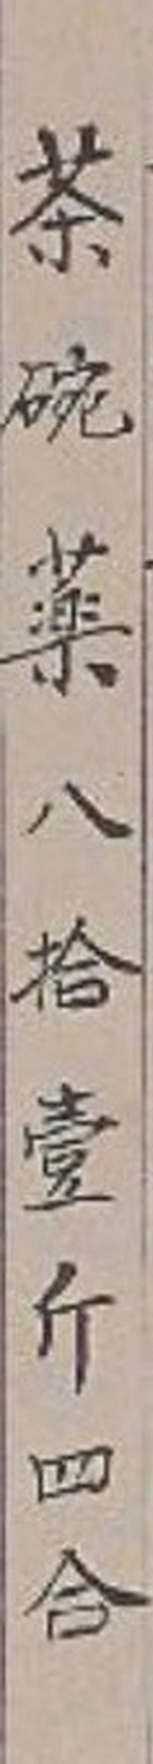茶碗薬八拾壹斤四合

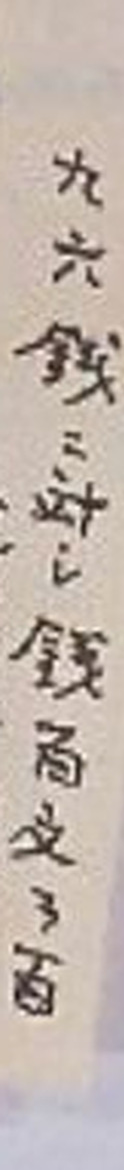九六銭ニ対シ銭百３百

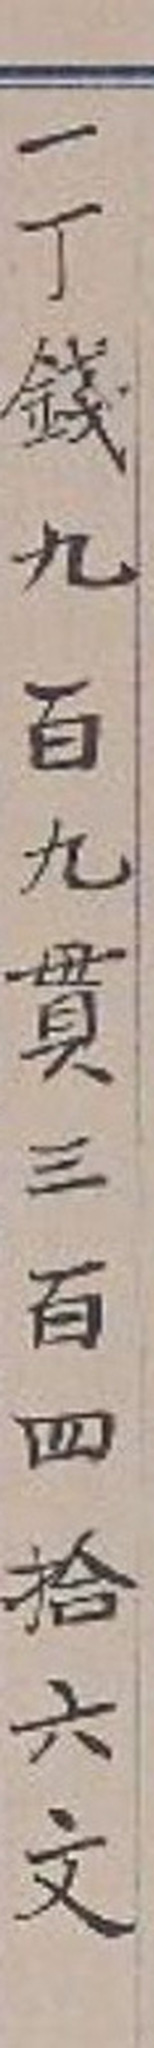一丁錢九百九貫三百四拾六文
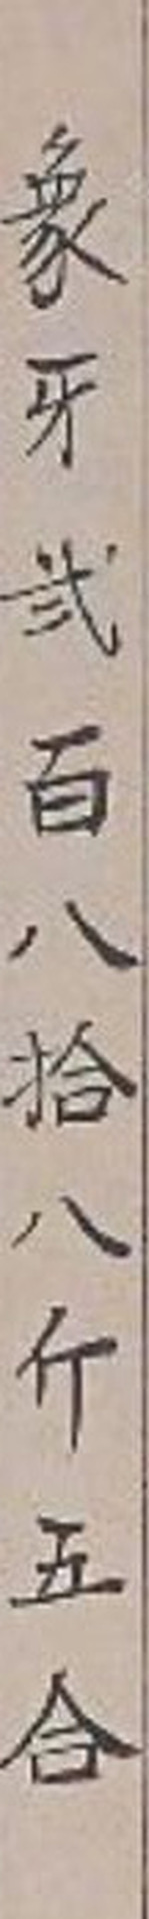象牙弐百八拾八斤五合
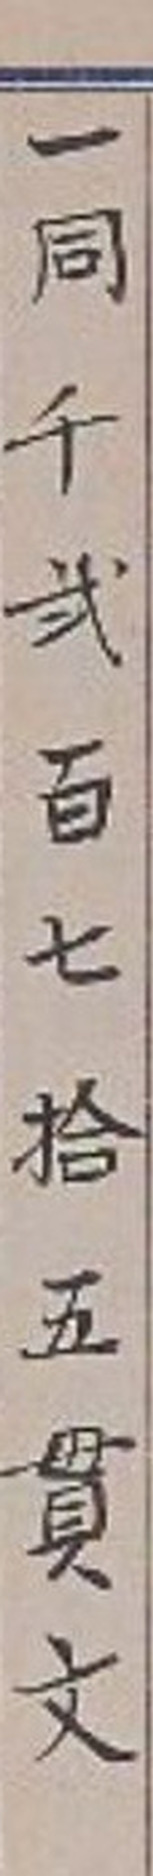一同千弐百七拾五貫文
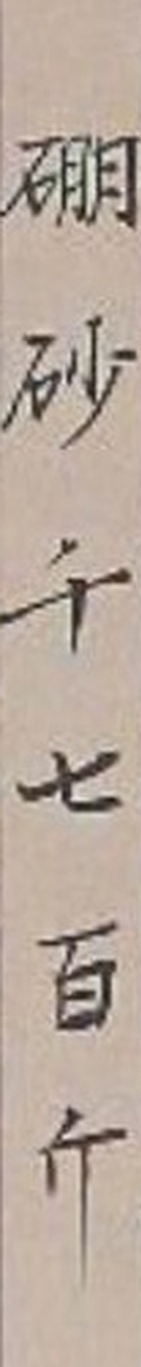硼砂千七百斤
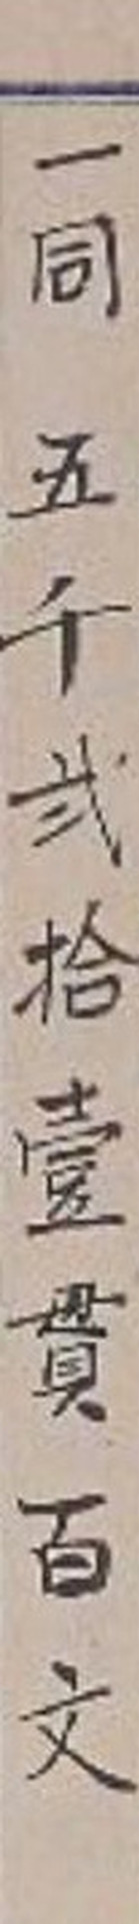一同五千弐拾壹貫百文
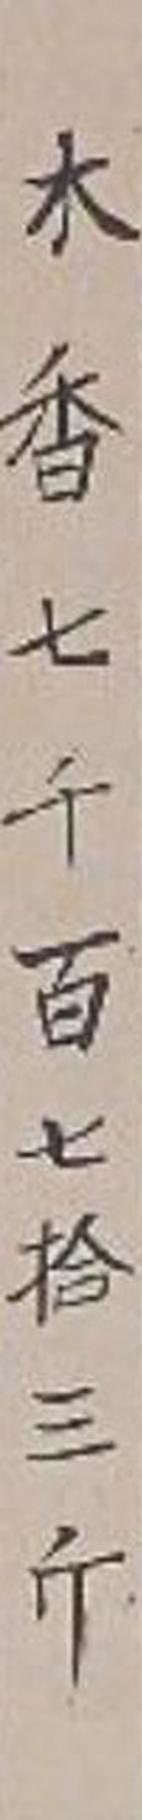木香七千百七拾三斤
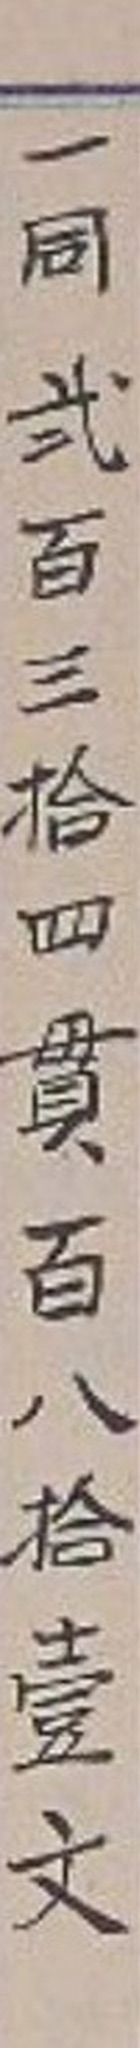一同弐百三拾四貫百八拾壹文
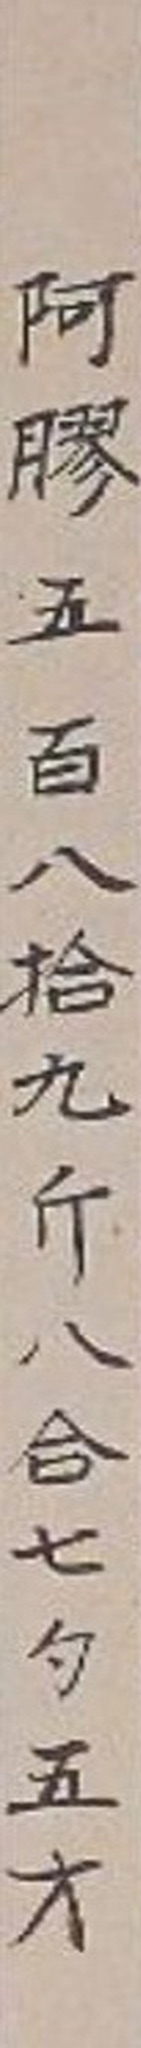阿膠五百八拾九斤八合七勺五才
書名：琉球産物於長崎拂立並本手品利潤総帖 弘化四年より酉年迄
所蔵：University of the Ryukyus Library
